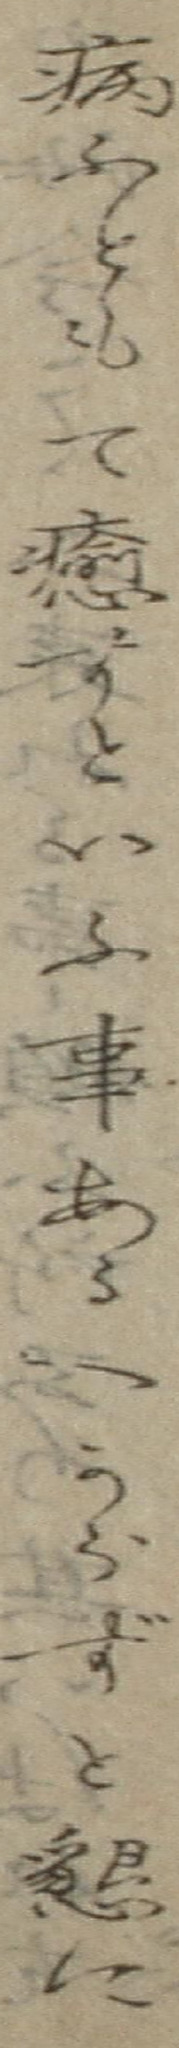病ふともて癒すといふ事あるへからずと懇に
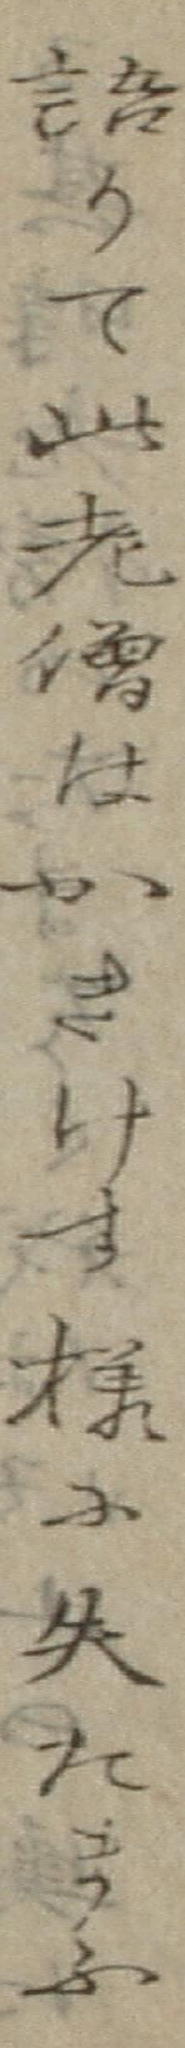語りて此老僧はかきけす様に失たまふ
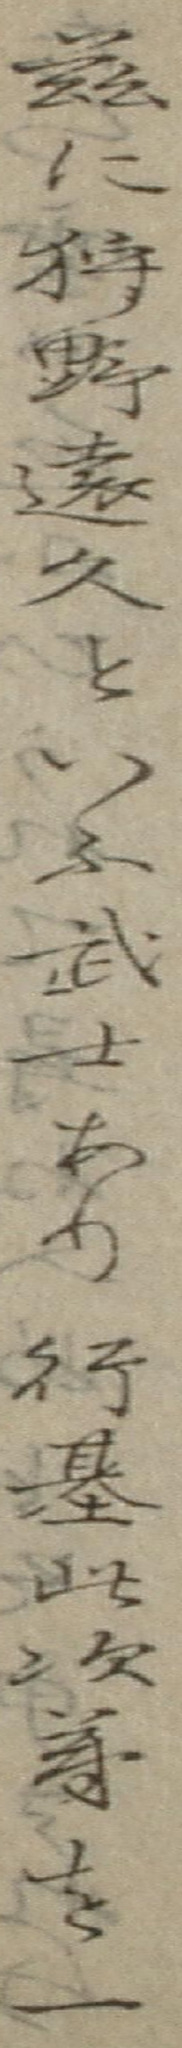茲に狩野遠久といふ武士あり行基此次第を一
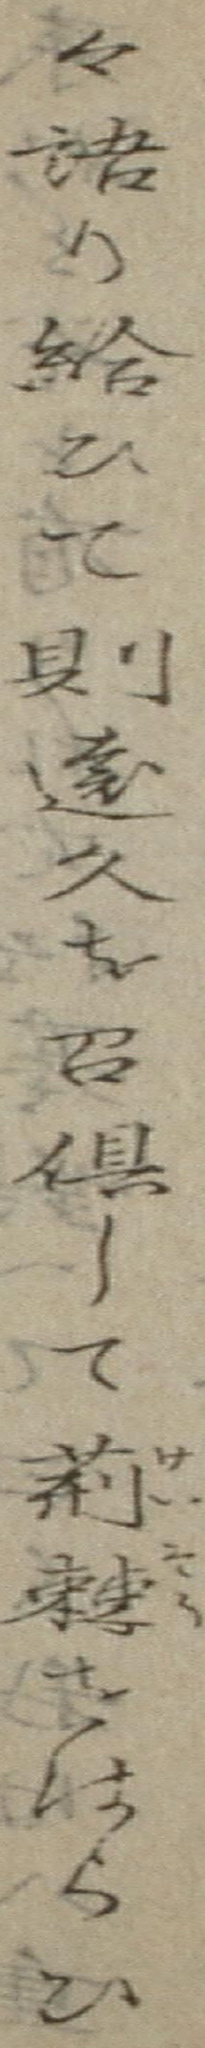々語り給ひて則遠久を召倶して荊棘をはらひ
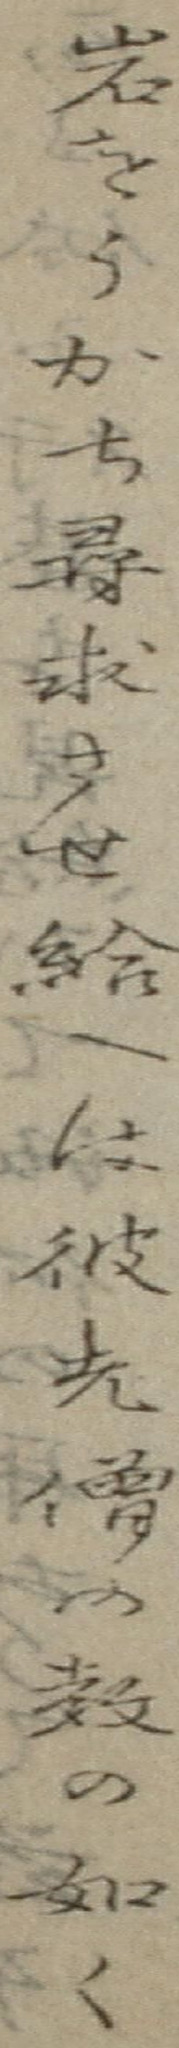岩をうかち尋求させ給へば彼老僧の教の如く
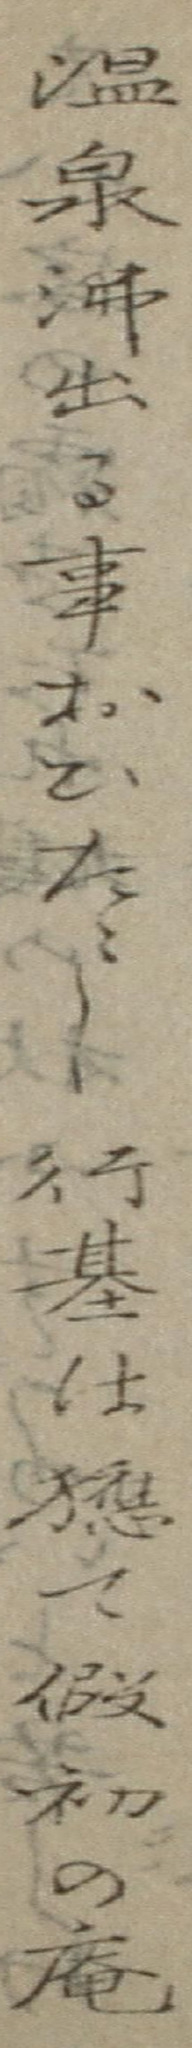温泉沸出る事おひたゞし行基は軈て仮初の庵
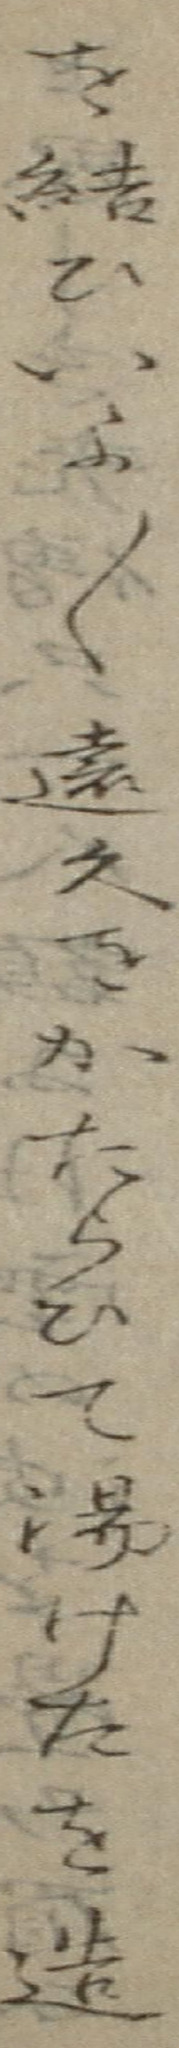を結ひいよ〳〵遠久をかたらひて湯けたを造
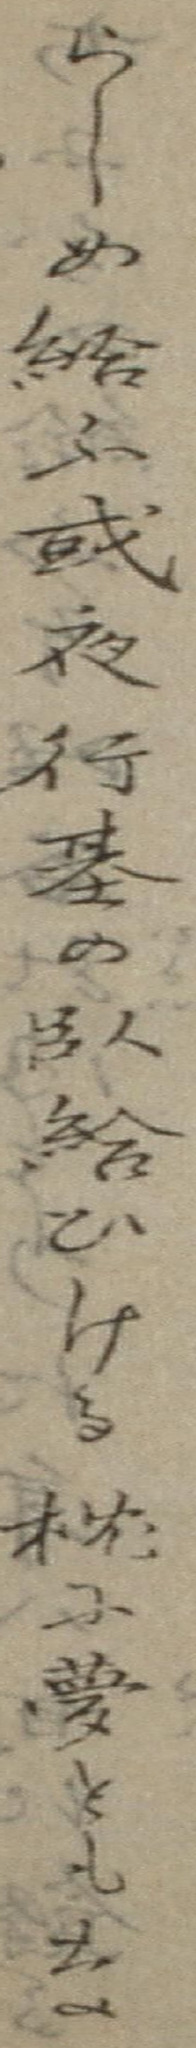らしめ給ふ或夜行基の臥給ひける枕に夢ともな
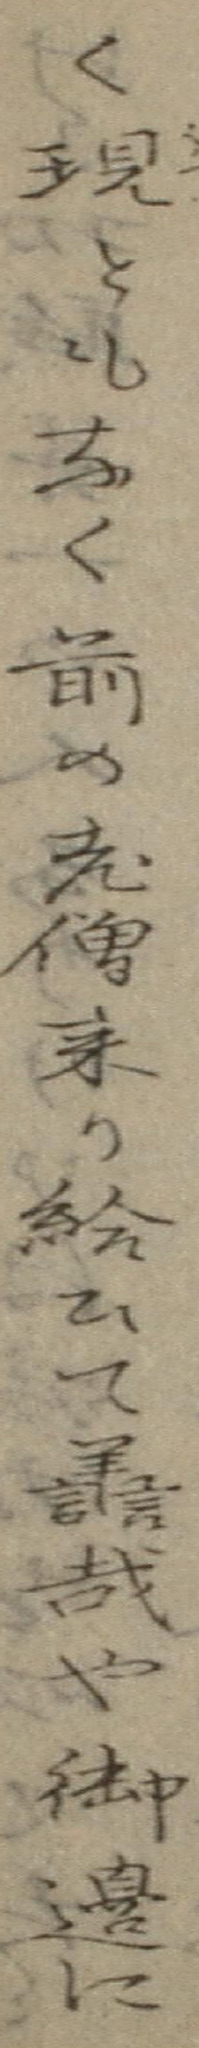く現ともなく前の老僧来り給ひて善哉や御辺に
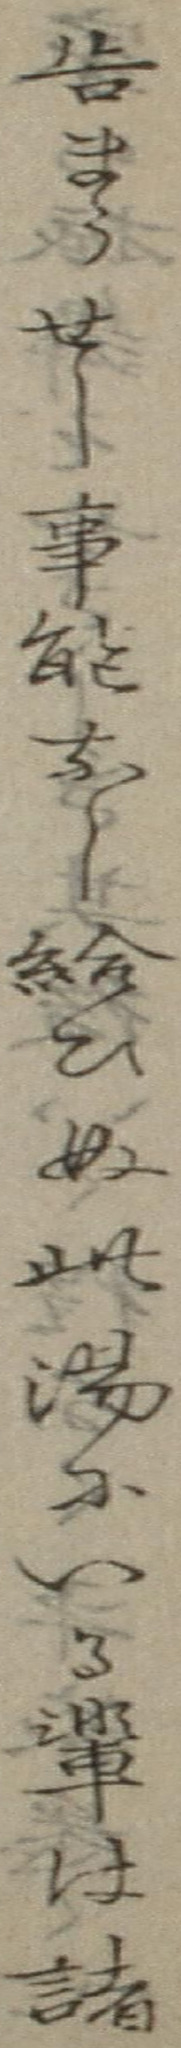告まうせし事能なし給ひぬ此湯にいる輩は諸
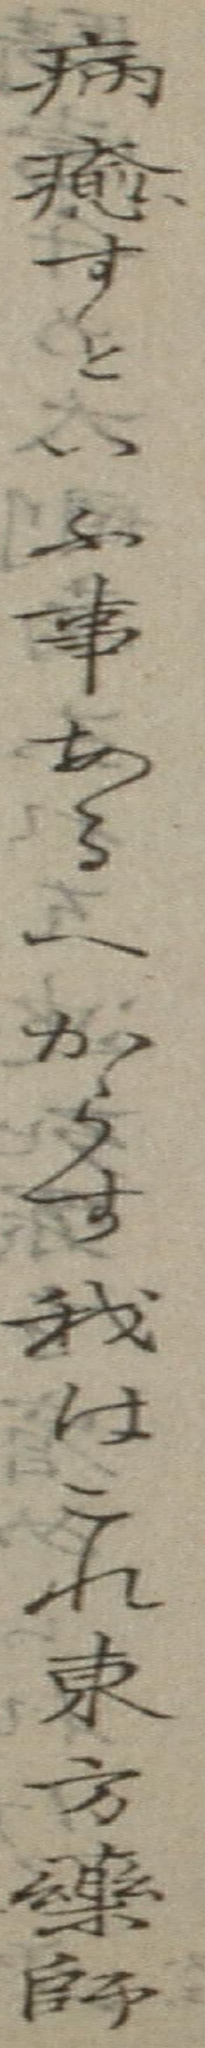病癒すといふ事あるへからす我はこれ東方薬師
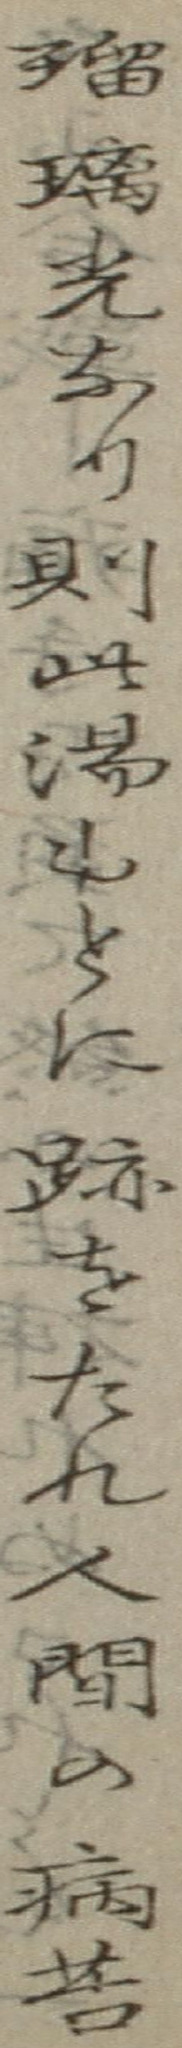瑠璃光なり則此湯もとに跡をたれ人間の病苦
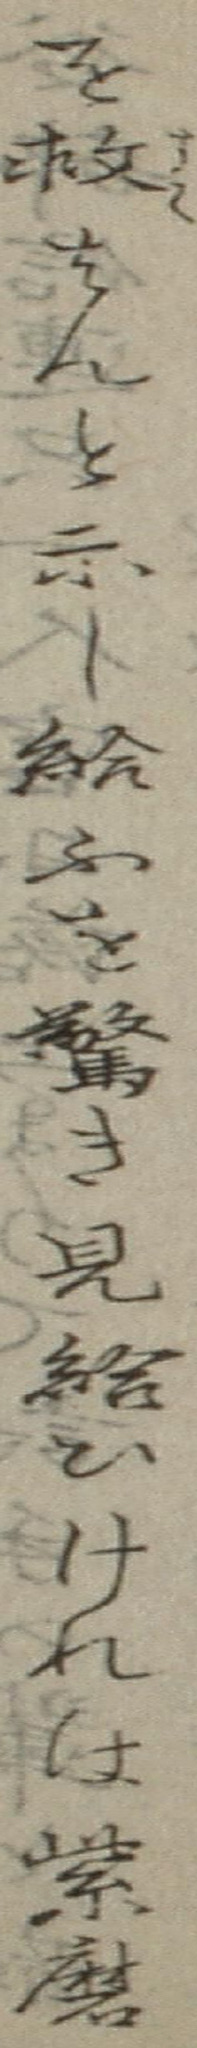を救はんと示し給ふを驚き見給ひけれは紫磨
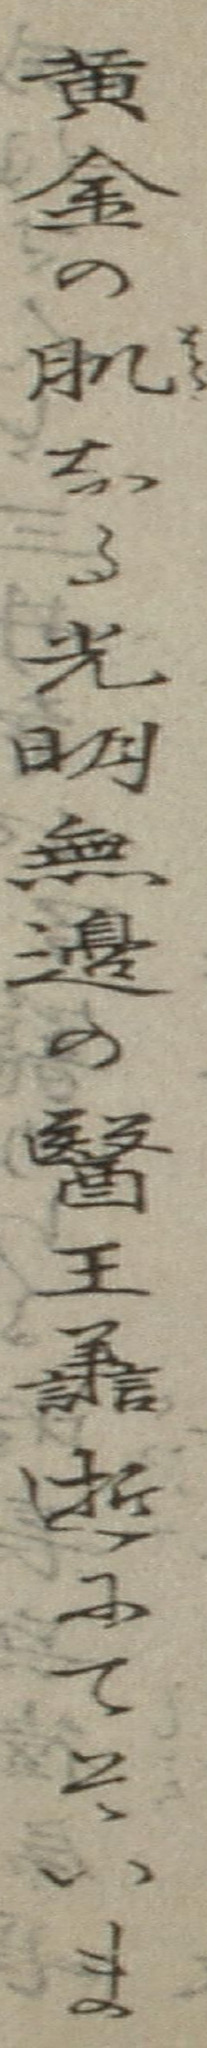黄金の肌なる光明無辺の医王善逝にてそいま
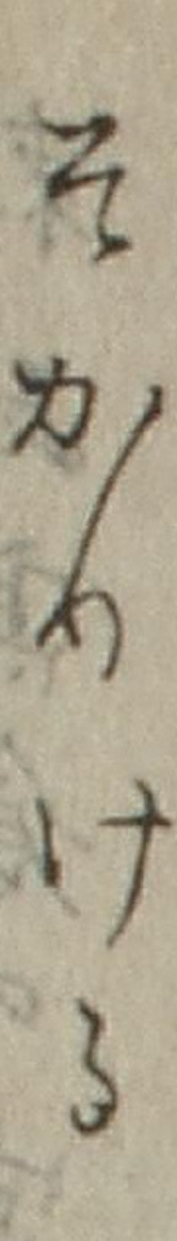そかりける
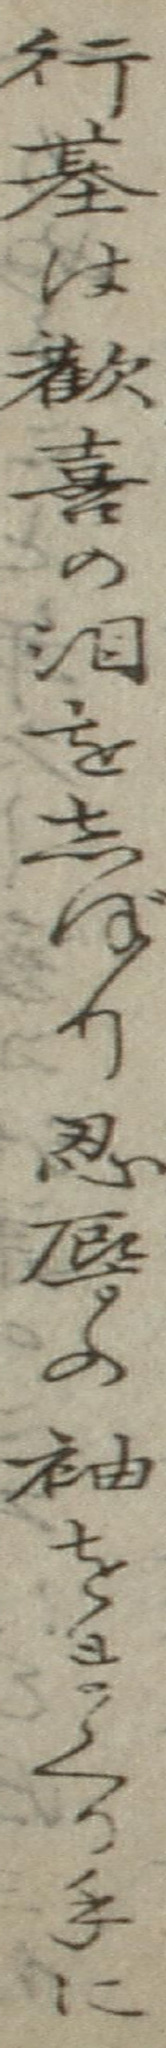行基は歓喜の泪をしぼり忍辱の袖をまくり手に
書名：山中温泉縁記并ニ入浴之心得
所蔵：東京大学地震研究所図書室 Earthquake Research Institute Library, The University of Tokyo, JAPAN
